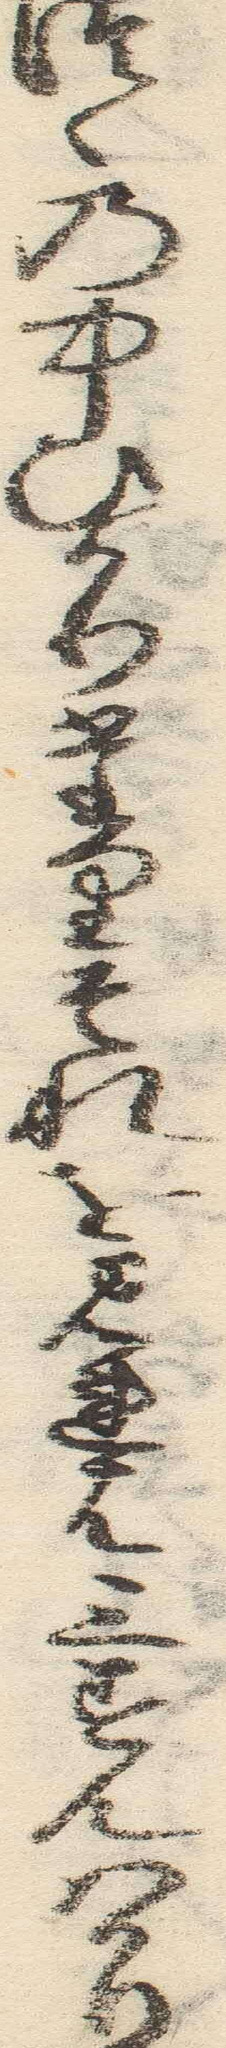つゝの中ひかりたりそれを見れは三すんはかり
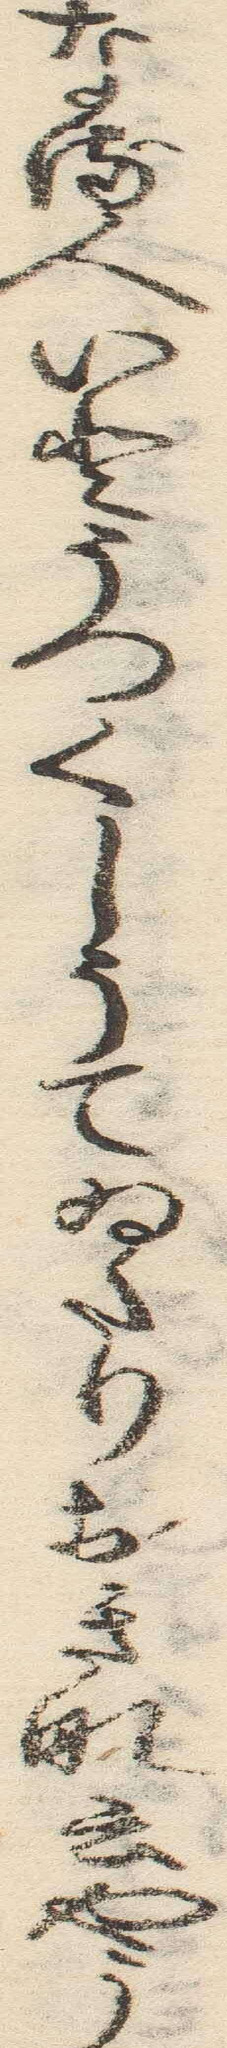なる人いとうつくしうてゐたりおきな云やう
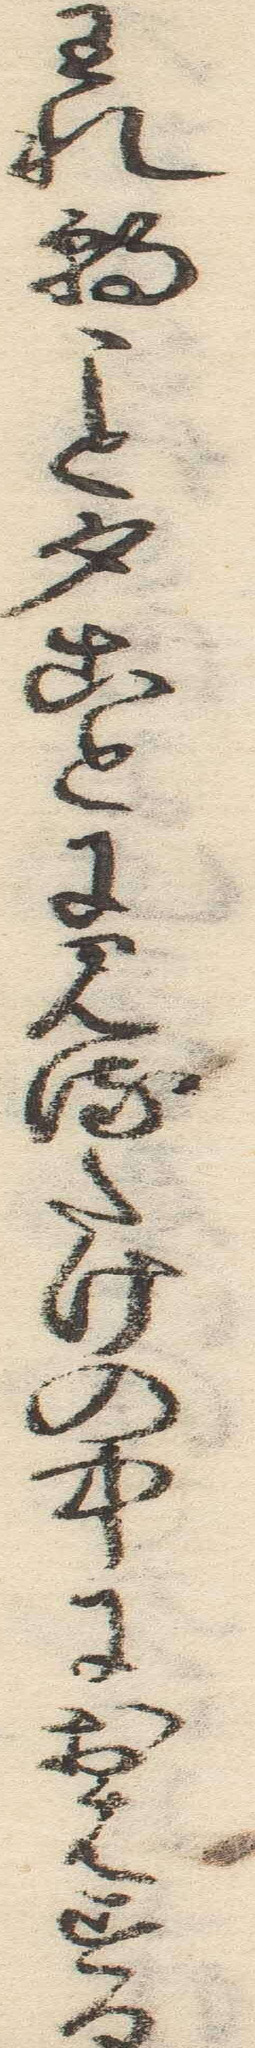われ朝こと夕ことに見るたけの中におはする
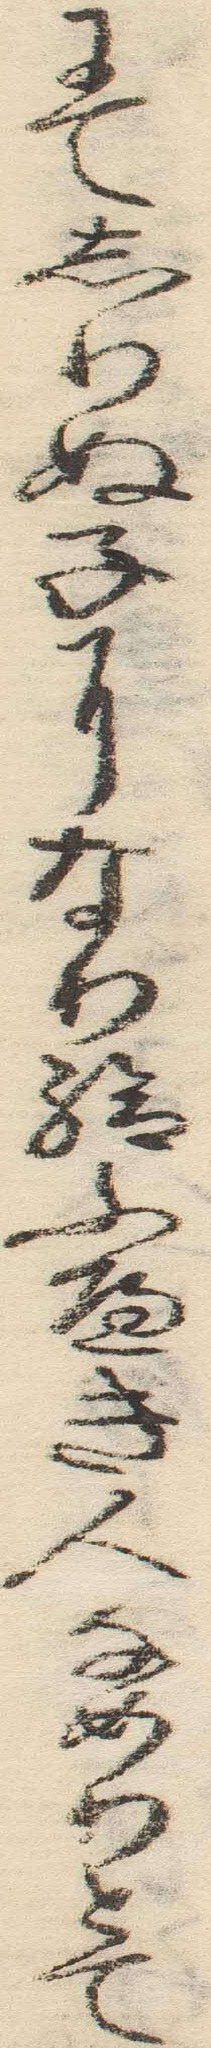にてしりぬ子になり給ふへき人なめりとて
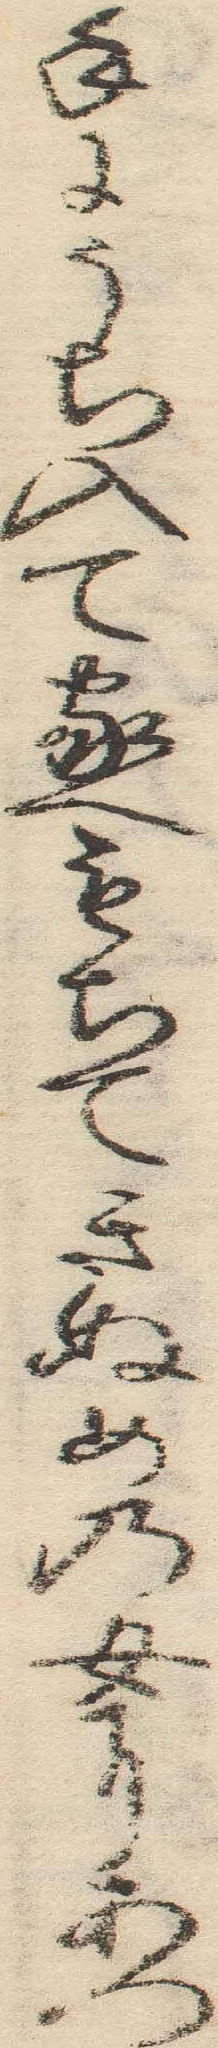手にうち入て家へもちてきぬめの女にあつ

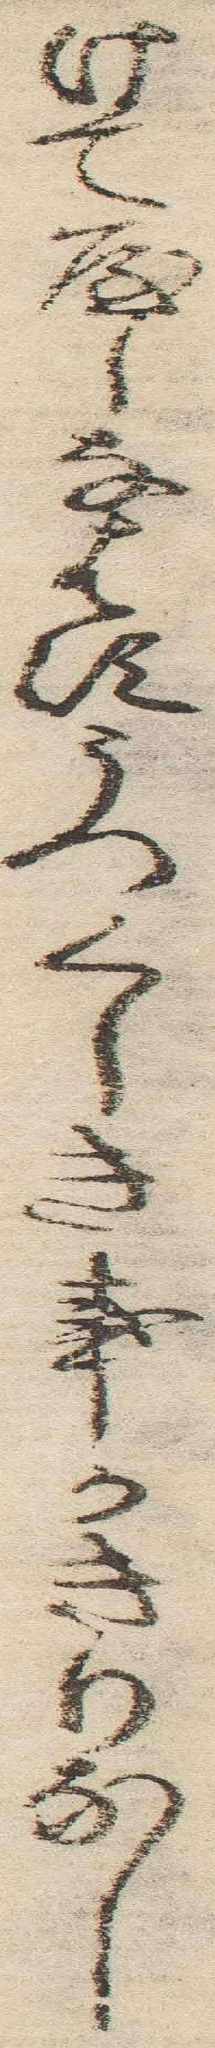けてやしなはすうつくしき事かきりなし
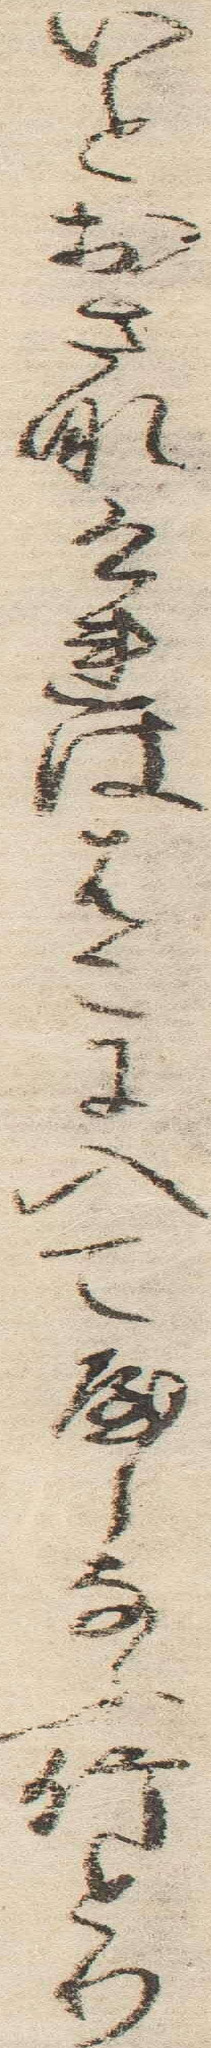いとおさなけれははこに入てやしなふ竹とり
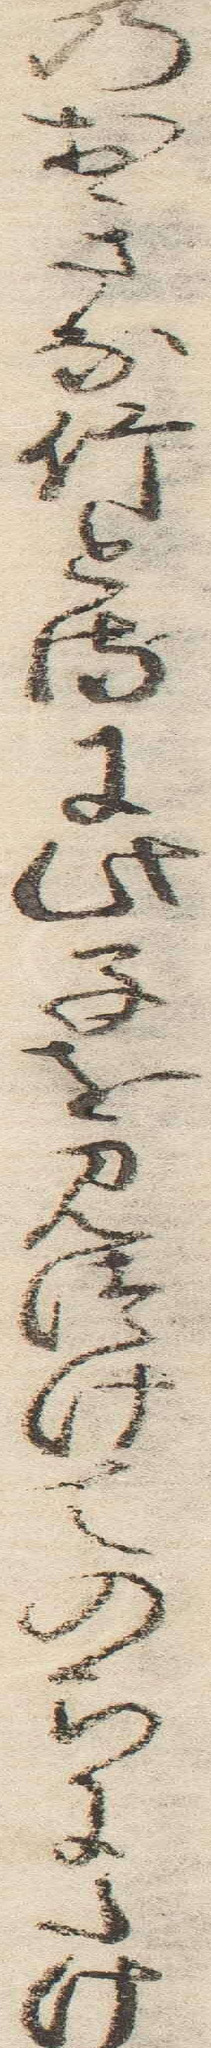のおきな竹とるに此子を見つけてのちにたけ
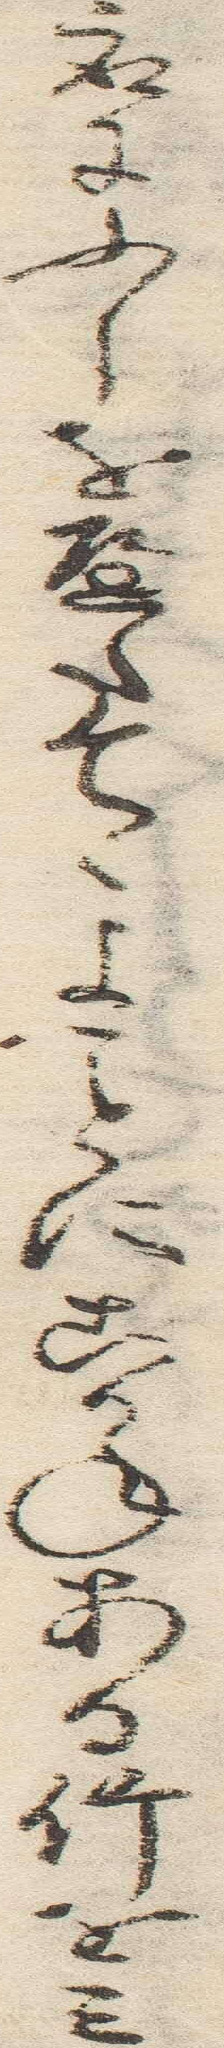取にふしをへたてゝよことにこかねある竹をみ
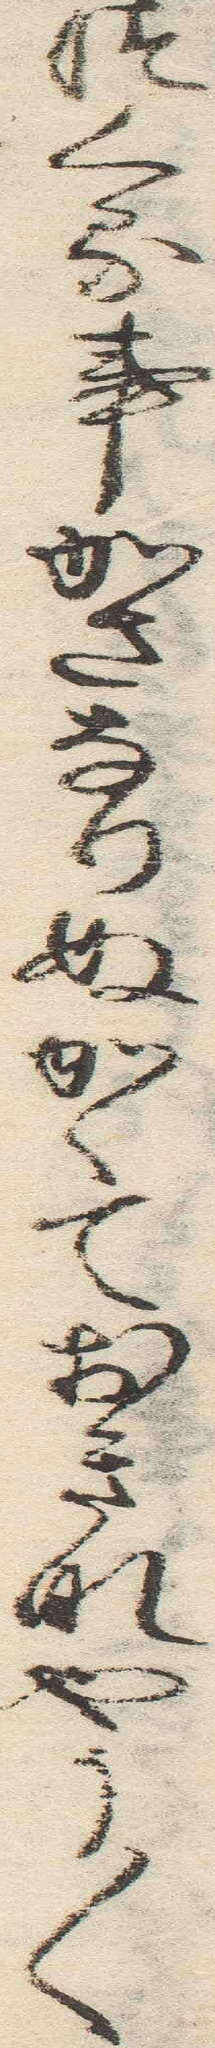つくる事かさなりぬかくておくなやう〳〵
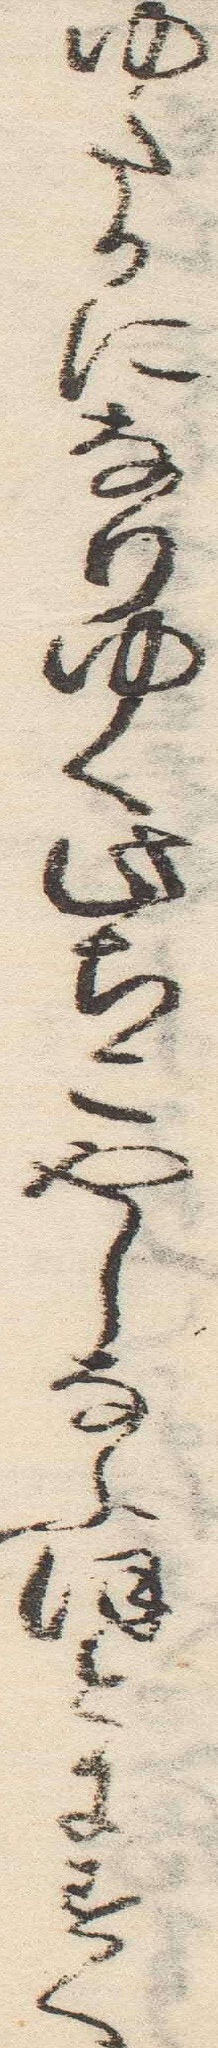ゆたかになりゆく此ちこやしなふほとにすく
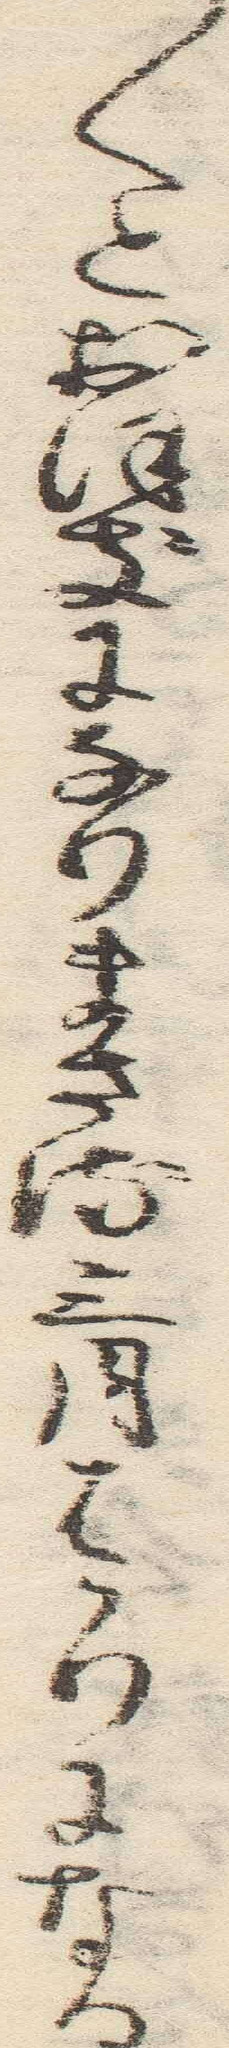〳〵とおほきになりまさる三月はかりになる
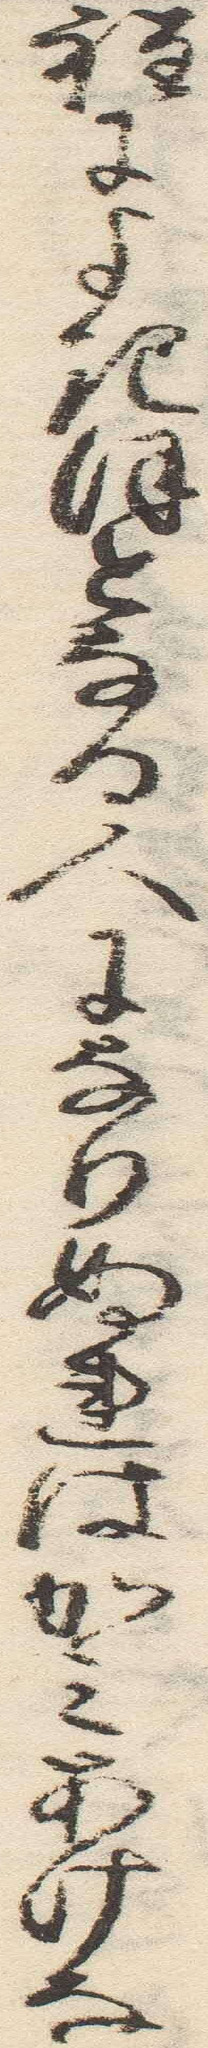程によきほとなる人になりぬれはかみあけな
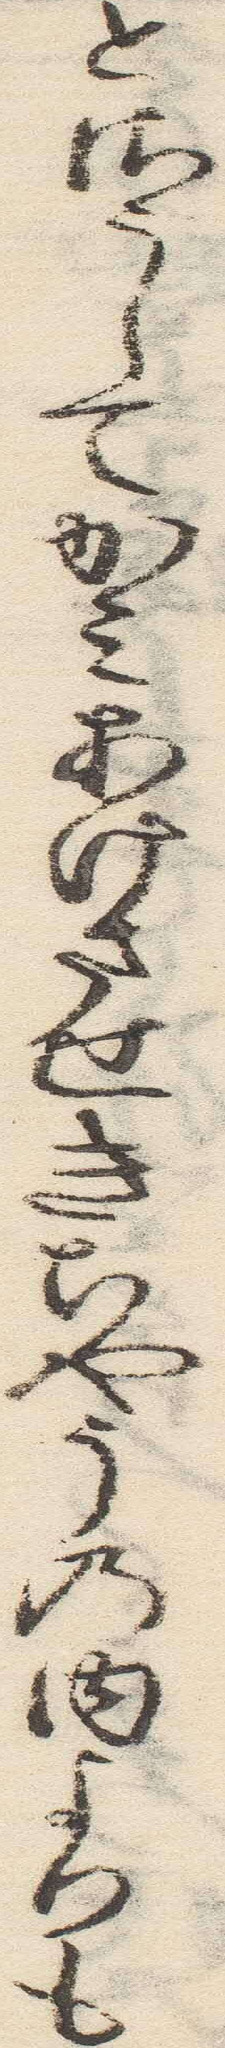とさうしてかみあけさせきちやうの内よりも
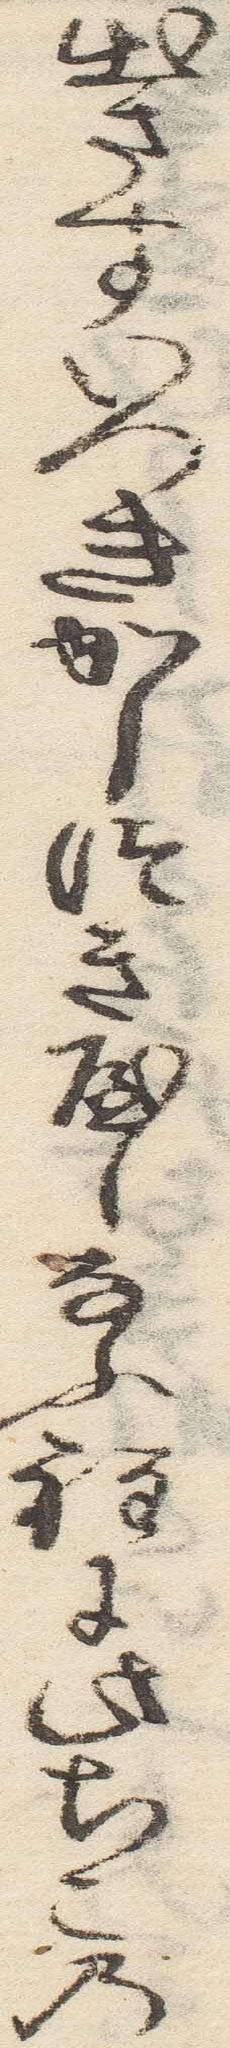出さすいつきかしつきやしなふ程に此ちこの
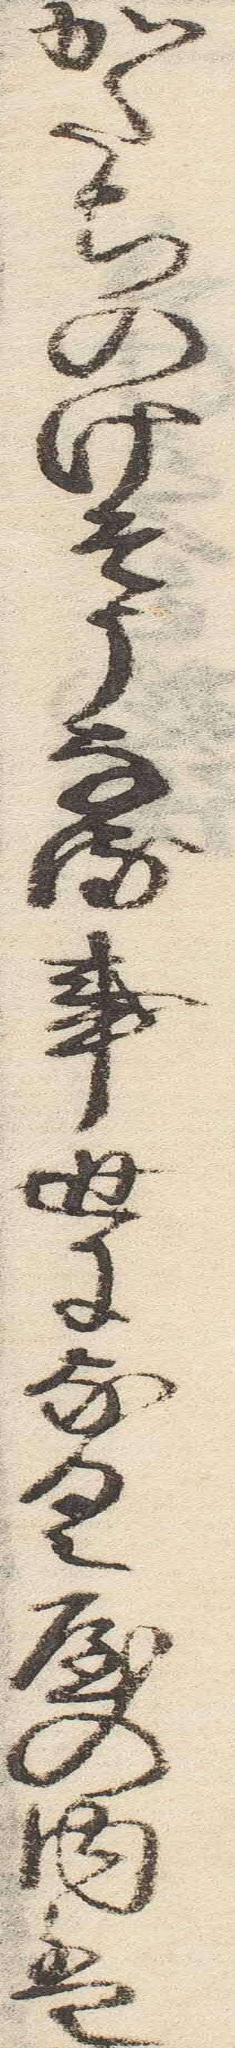かたかたちのけそうなる事世になく屋の内は
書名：竹取物語
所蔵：東京学芸大学附属図書館 国文学研究資料館
